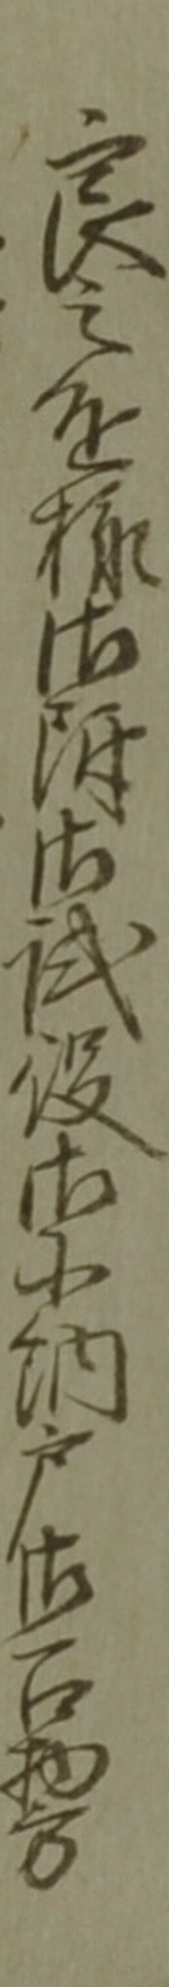良之進様御附御試役御小納戸御召物方
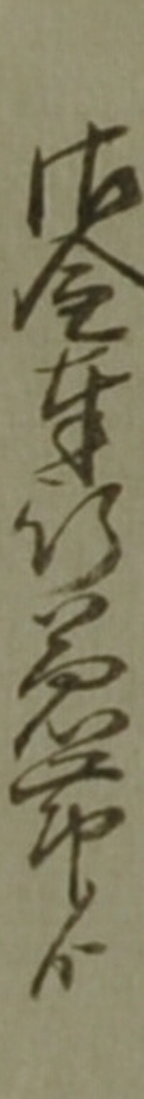御金奉行兼帯ゟ
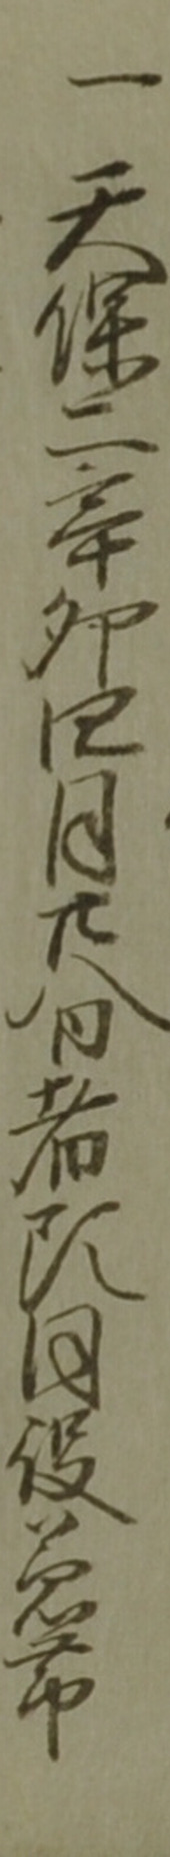一天保二辛卯四月廿八日者頭同役兼帯
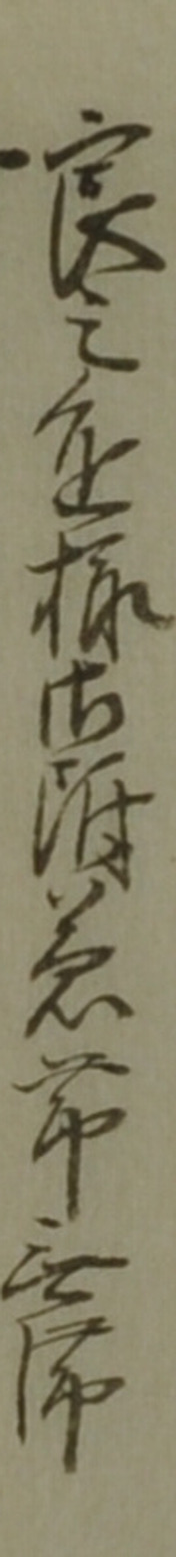良之進様御附兼帯無滞
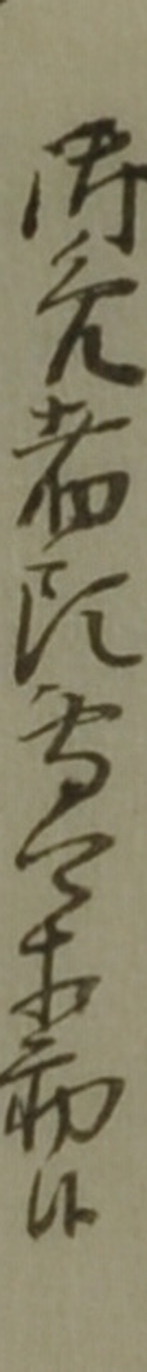御免者頭専可相勤候
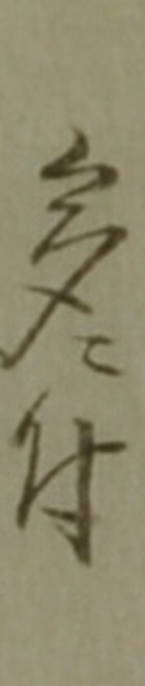多ニ付
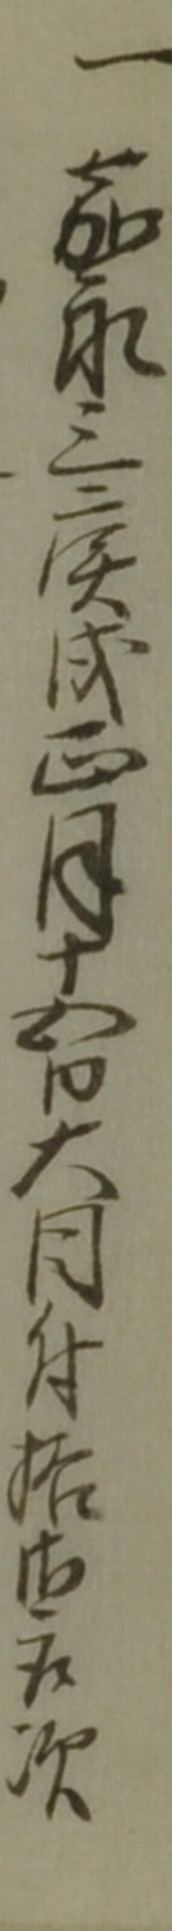一嘉永三庚戌正月十五日大目付格御取次
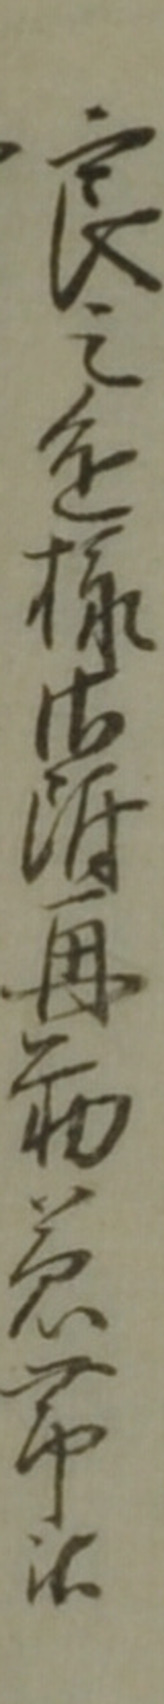良之進様御附再勤兼帯被
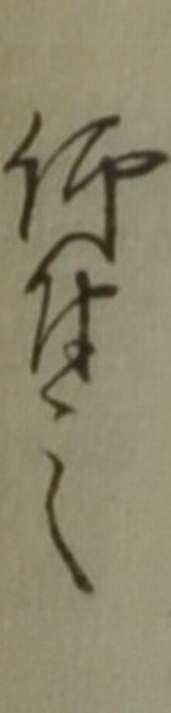仰付之
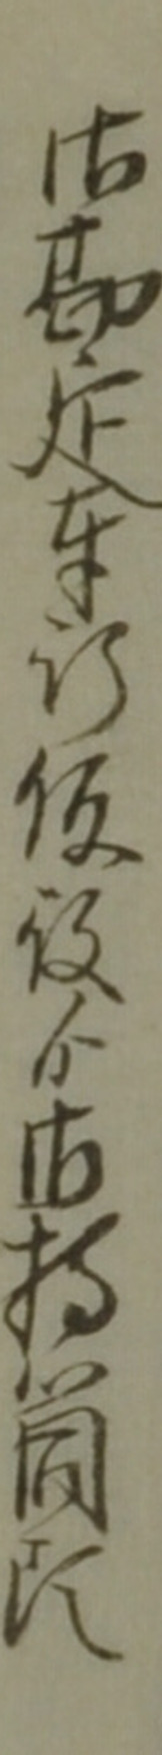御勘定奉行仮役ゟ御持筒頭
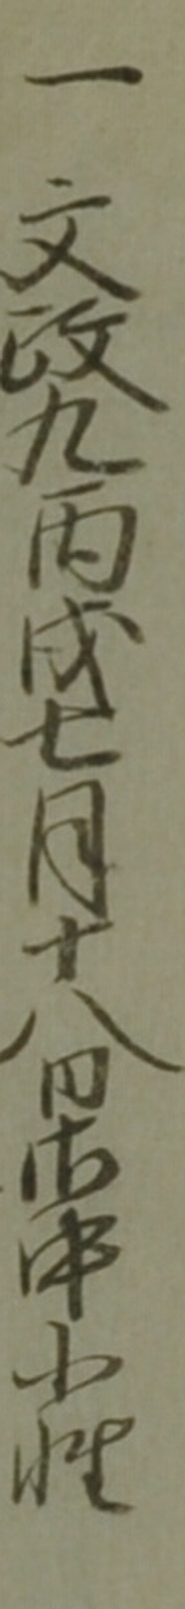一文政九丙戌七月十八日御中小性
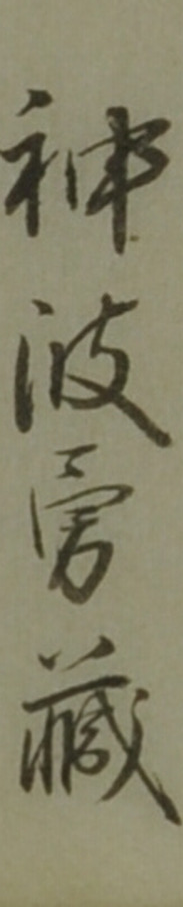神波勇蔵
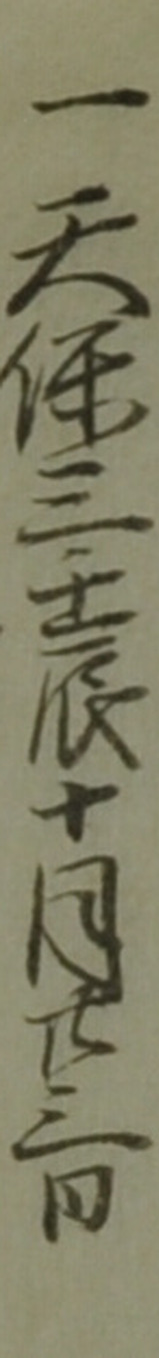一天保三壬辰十月廿三日
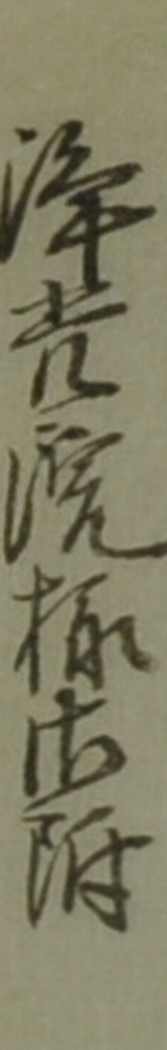浄光院様御附
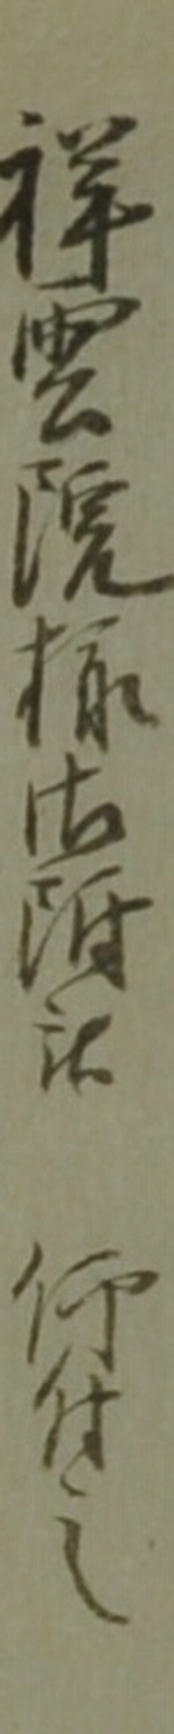祥雲院様御附被仰付之
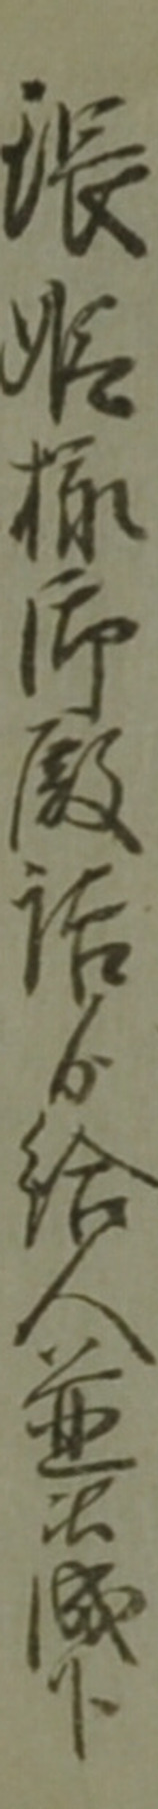鋹姫様御殿詰ゟ給人並被成下
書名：諸御役代々録（六）
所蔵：伊那市立高遠町図書館・合同会社AMANE
